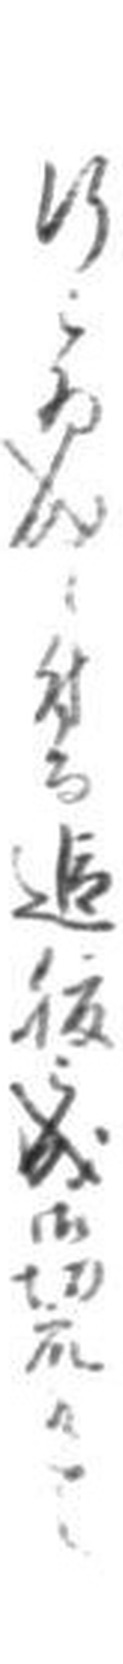行被為成候付而追腹被成御切衆有之
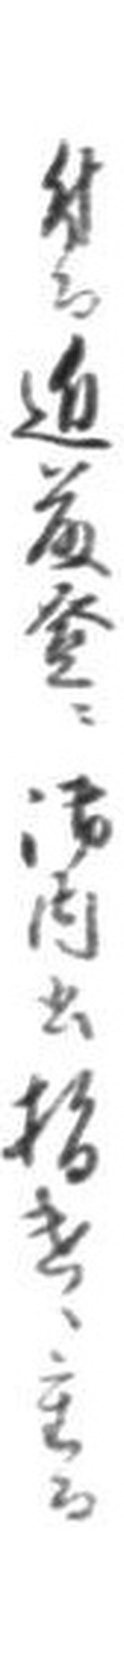付而近藤登ニ御内書指遣候重而
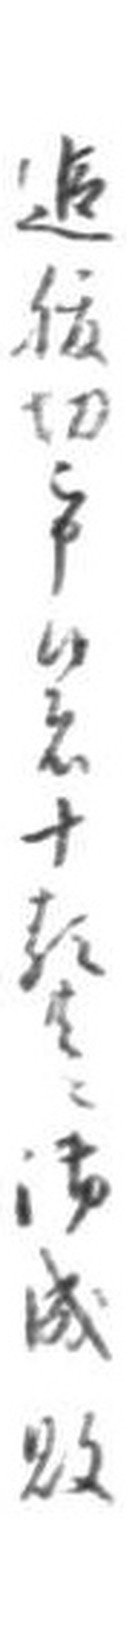追腹切被申候者十類共ニ御成敗
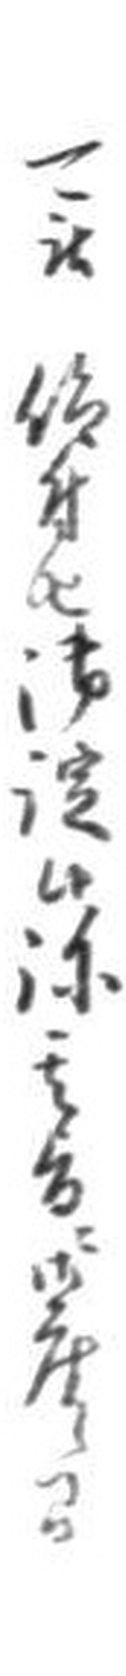可被仰付由御諚候弥其旨ニ御座候間
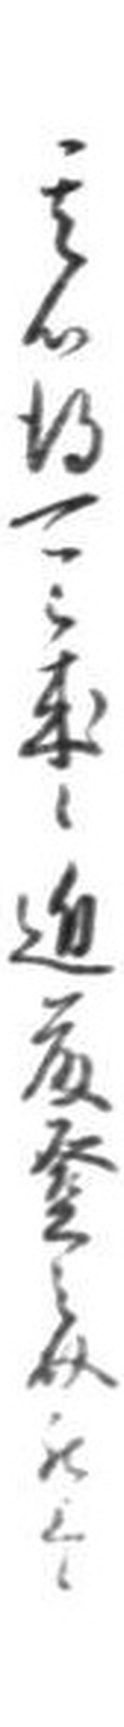其心得可被成候近藤登之介被上候

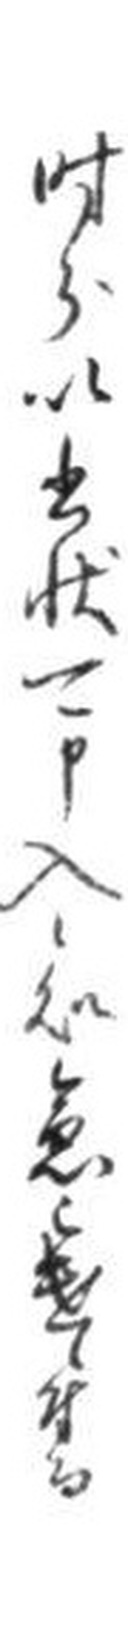時分以書状可申入候処急被遣候付而
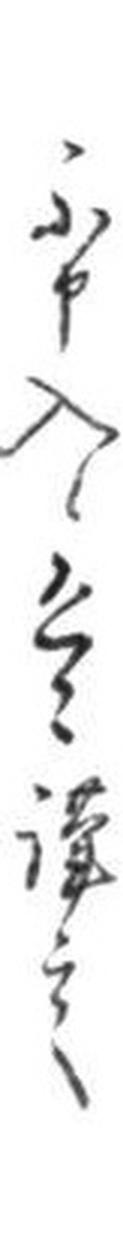不申入候恐々謹言
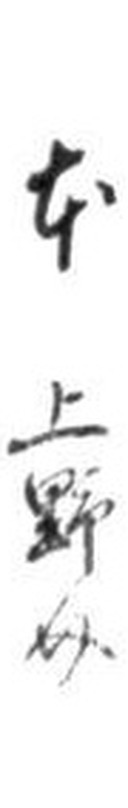本上野介
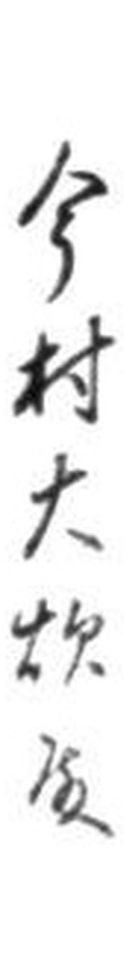今村大炊殿
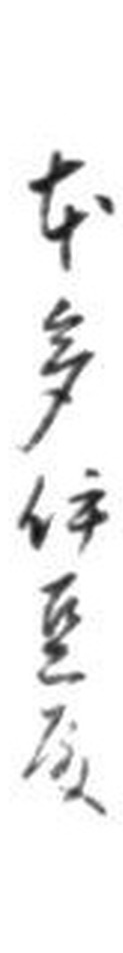本多伊豆殿
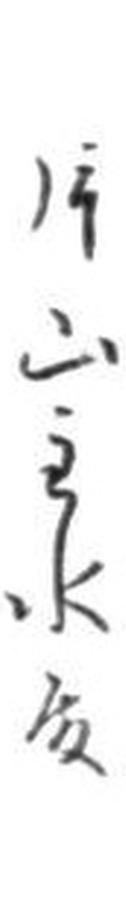片山主水殿
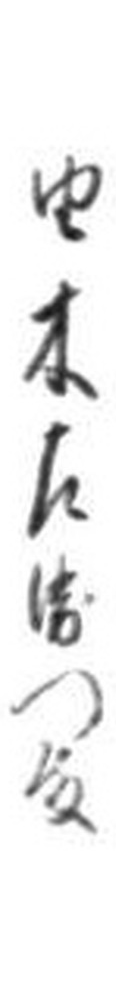由木左衛門殿
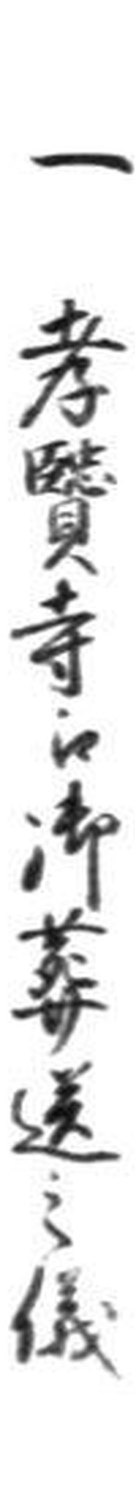一孝賢寺江御葬送之儀
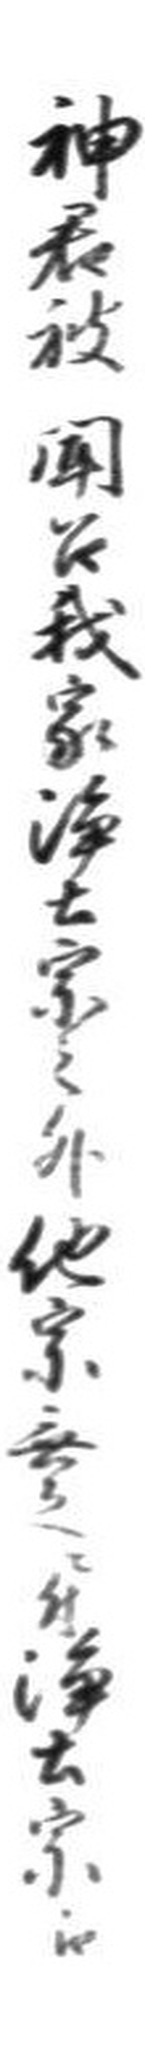神君被聞召我家浄土宗之外他宗無之ニ付浄土宗江
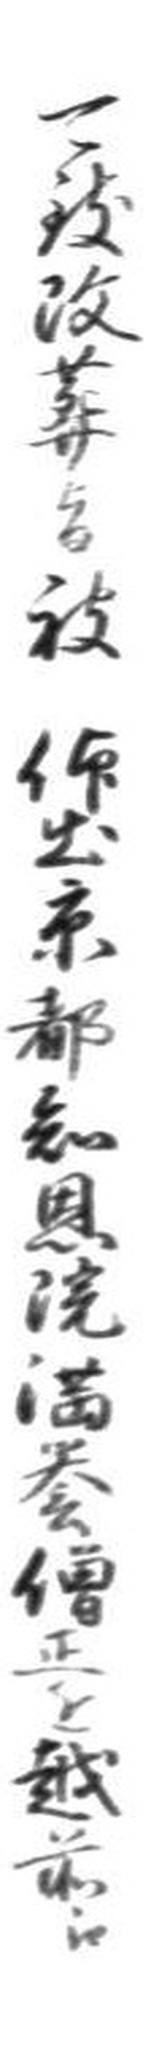可致改葬旨被仰出京都知恩院満誉僧正を越前江
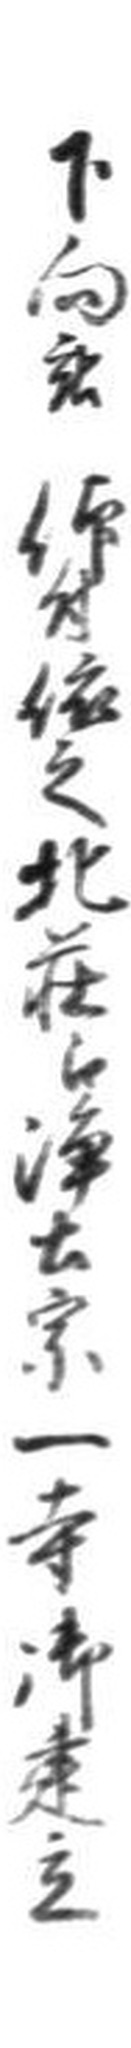下向被仰付依之北荘江浄土宗一寺御建立
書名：家譜 一 秀康公 従天正二年到慶長十二年
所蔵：福井県文書館 Fukui Prefectural Archives
